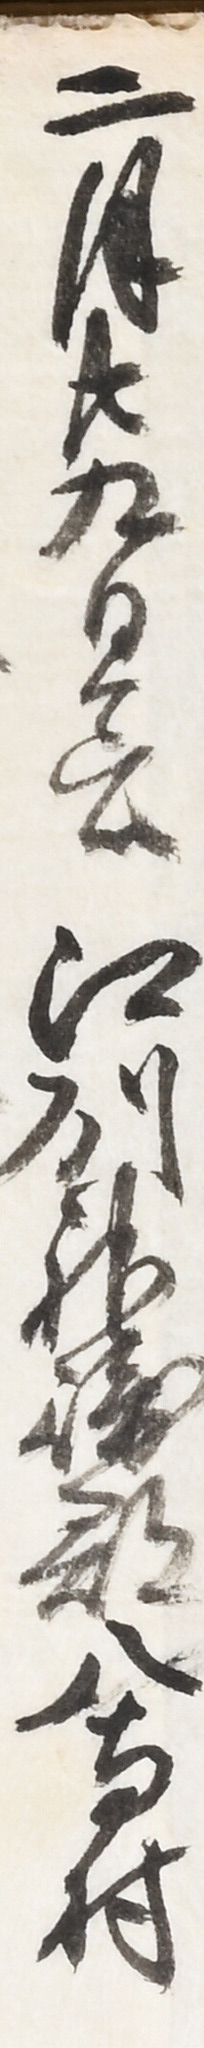二月廿九日着江州神崎郡八鳥村
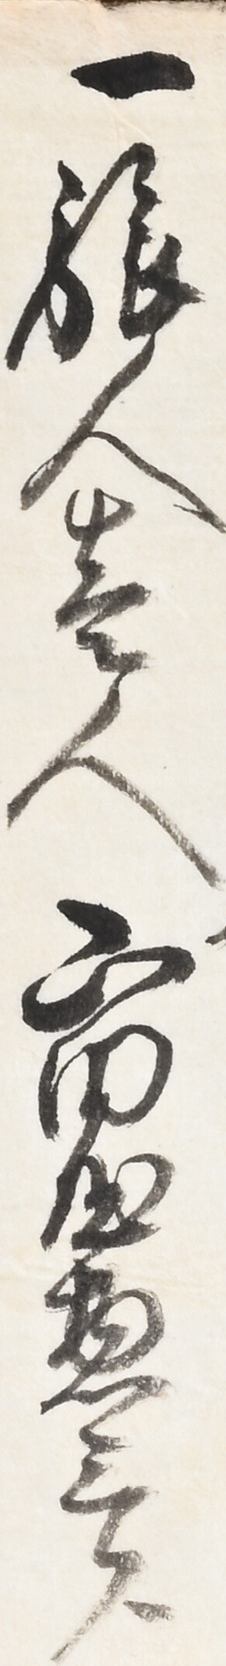一旅人壱人山田屋惣三郎
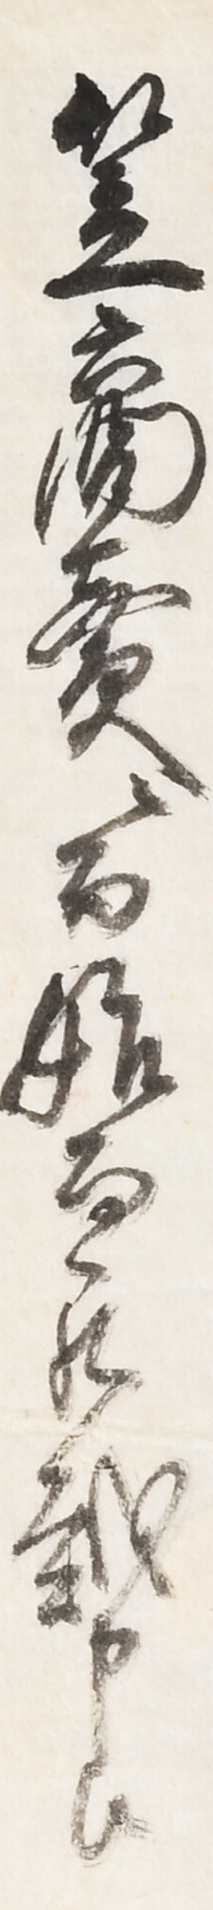笠商売ニ而始而罷越申候
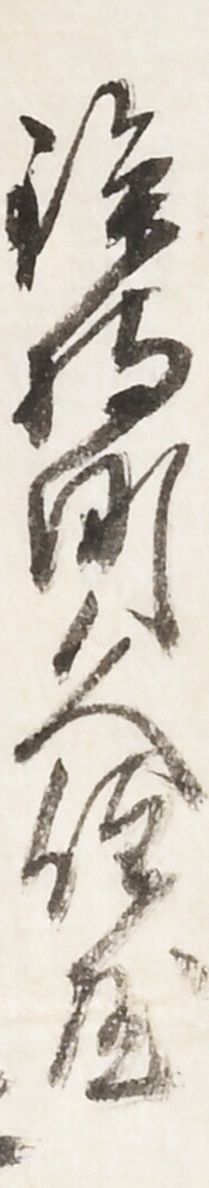鉾持町久住屋
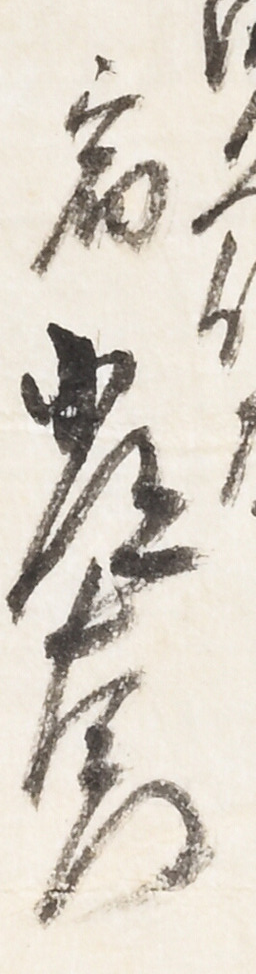宿常右衛門
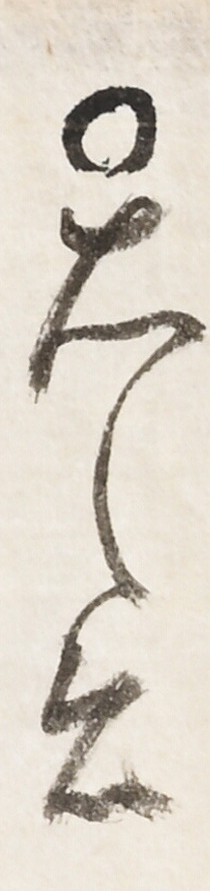〇右之者
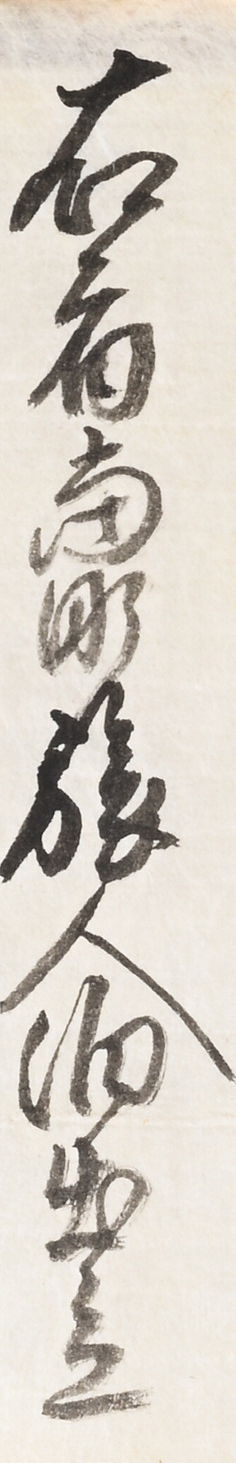右者当町旅人泊出立
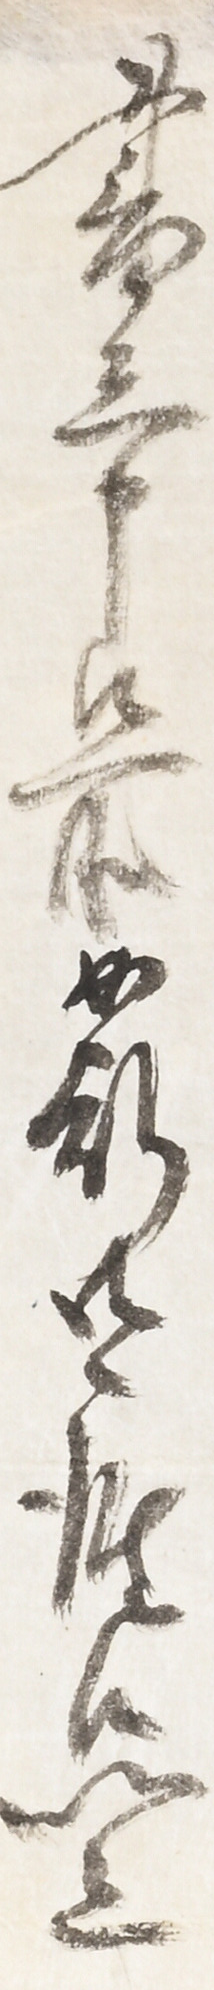書上申候所如斯御座候以上
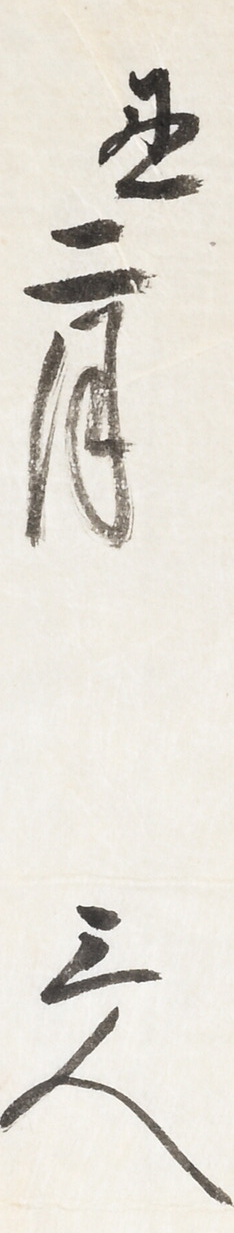丑二月三人
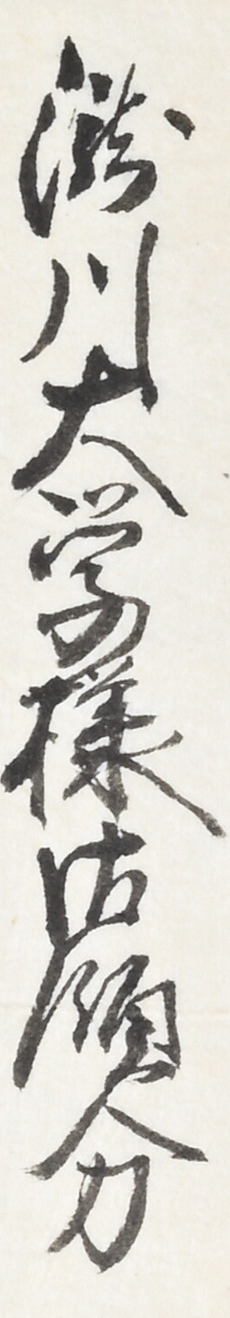瀧川大学様御領分
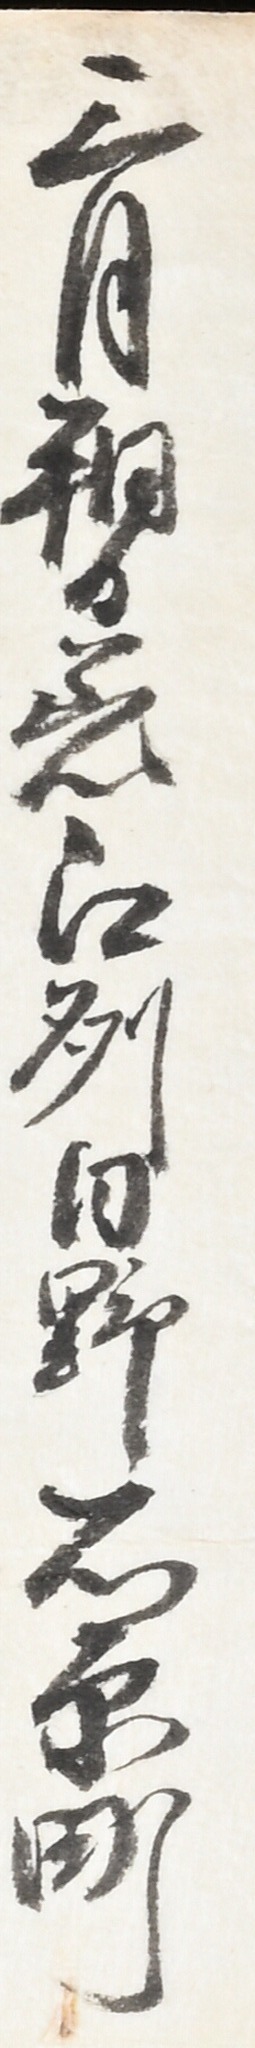三月朔日着江州日野石原町
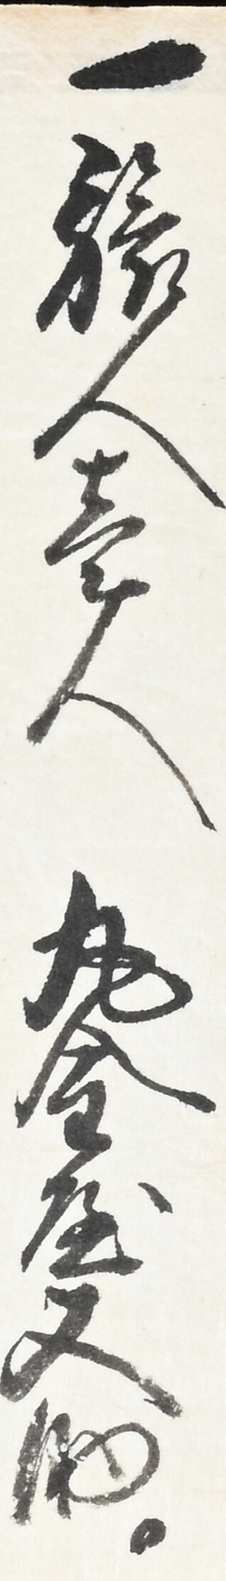一旅人壱人丸金屋又助。
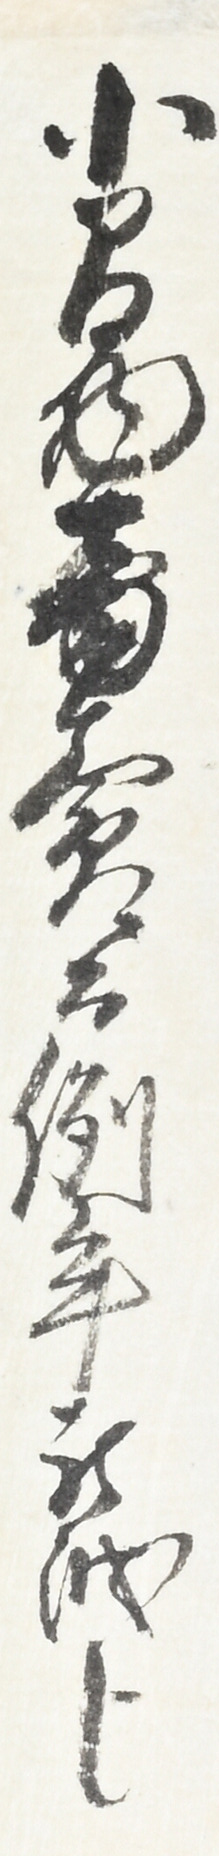小間物商売ニ而例年罷越申候

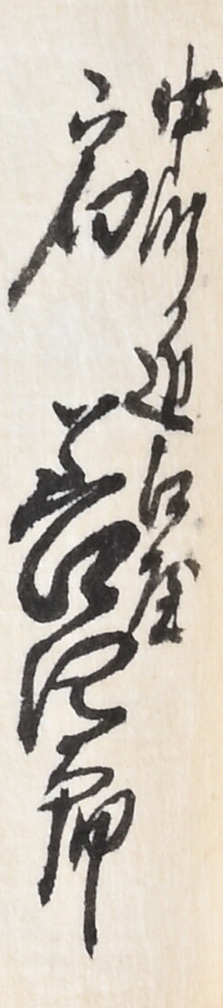宿善四郎
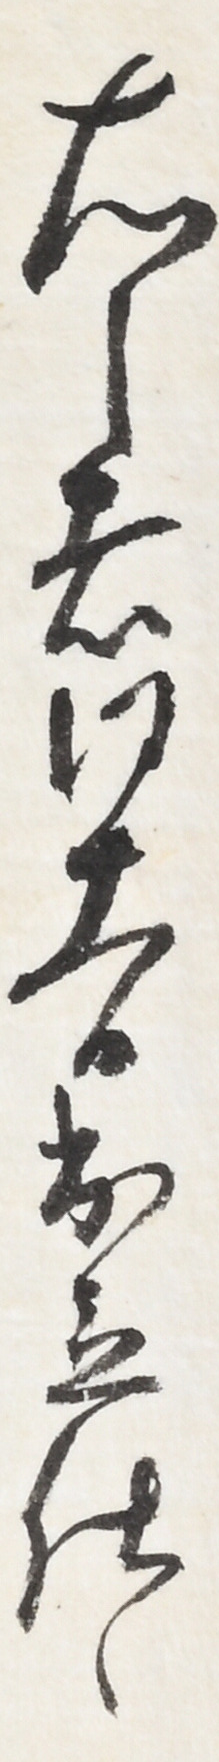右之者同十一日出立仕候
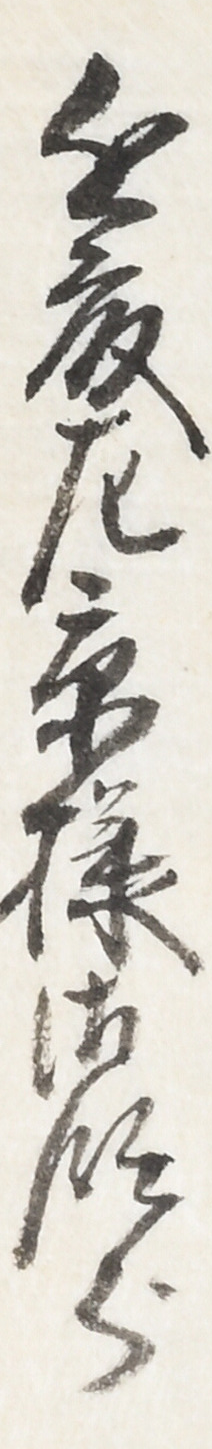近藤左京様御領分
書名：旅人泊控帳
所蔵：伊那市立高遠町図書館・合同会社AMANE
